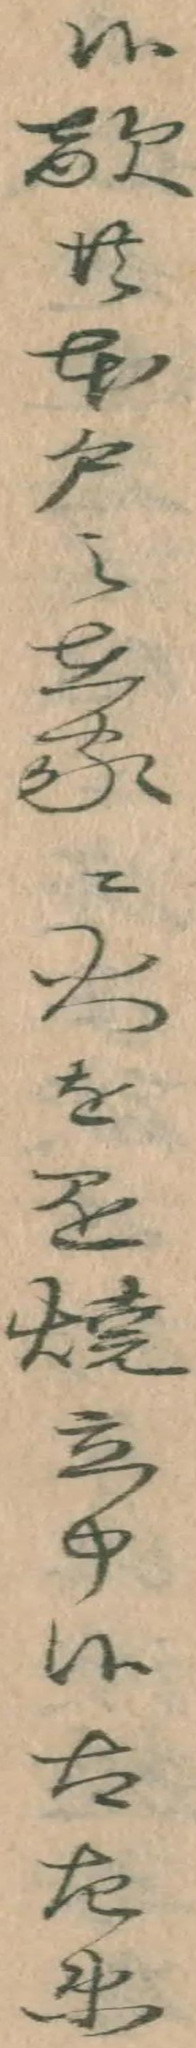候敵共本戸之在家に火を懸焼立申候太左衛
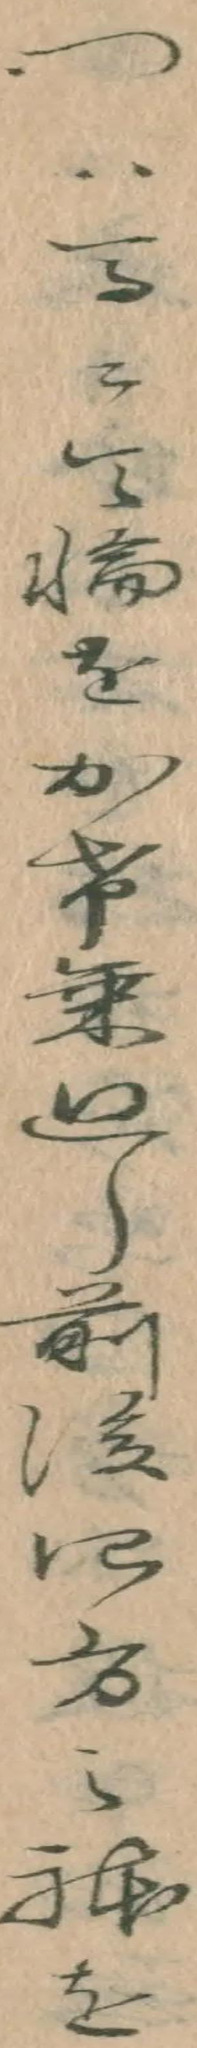門は馬に首輪をか希乗廻し前後四方之躰を
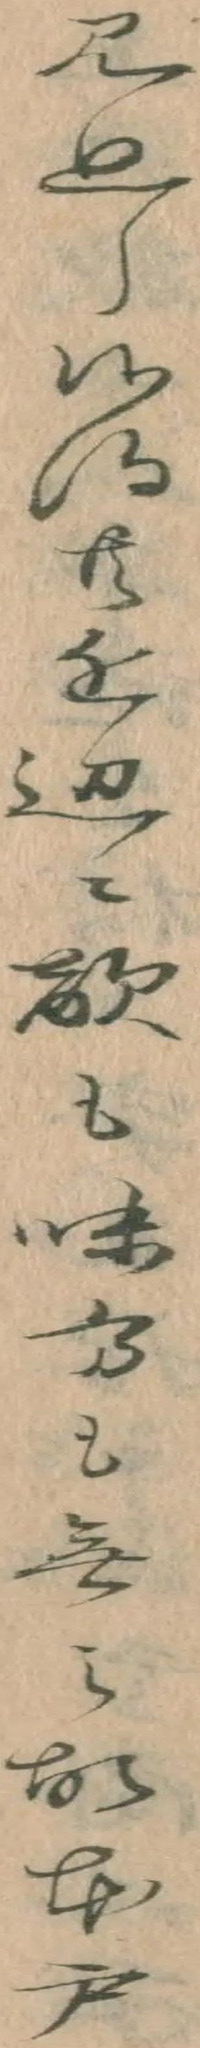見廻し候得共近辺に敵も味方も無之故本戸
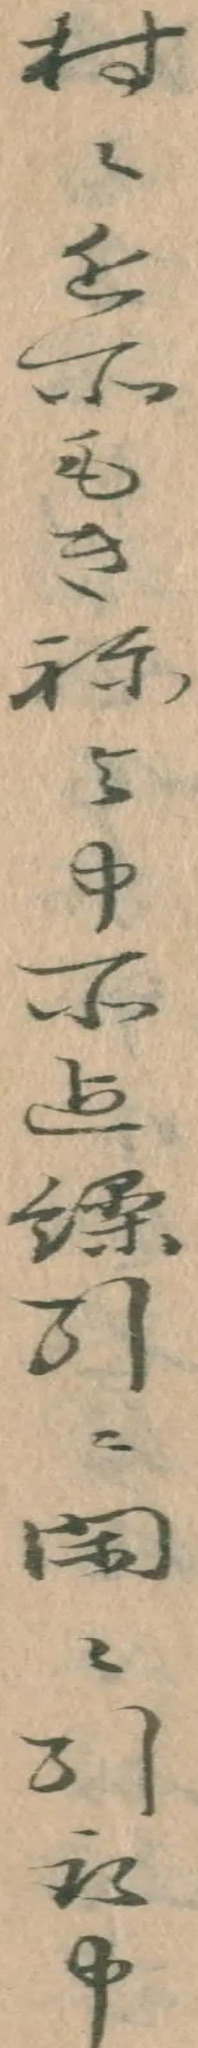村に近所もき祢与申所迄繰引に閑に引取申
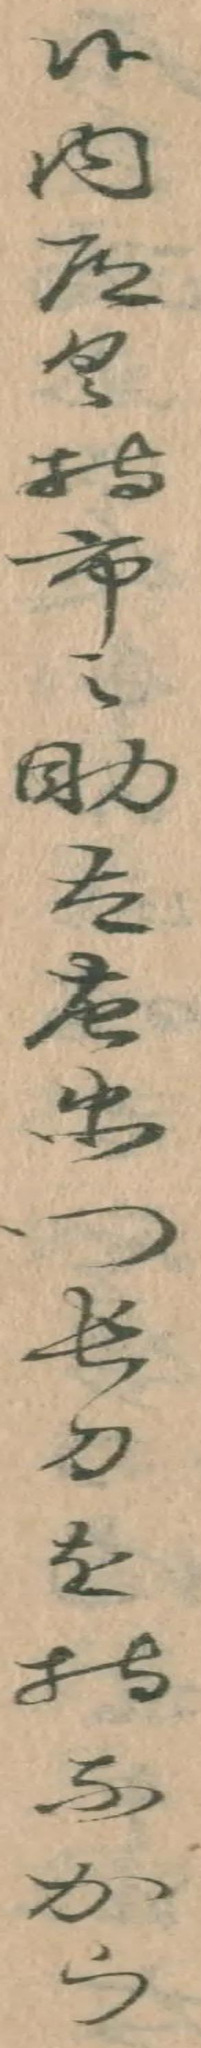候内道具持市之助太左衛門長刀を持なから
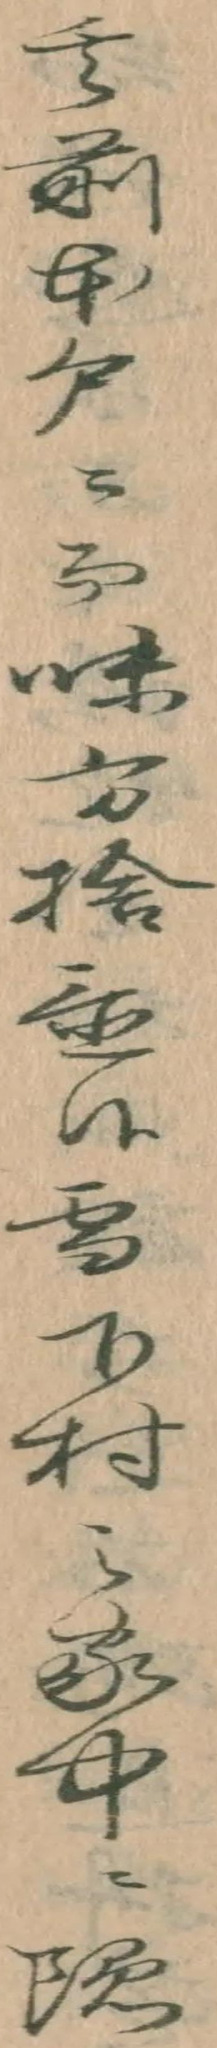其前本戸に而味方捨置候雪下村之家中に隠
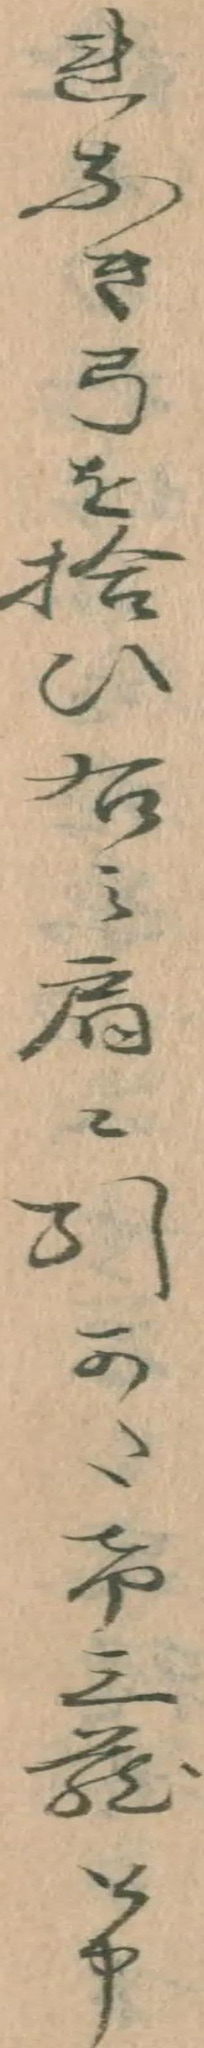連なき弓を拾ひ右之肩に引かた希三蔵と申
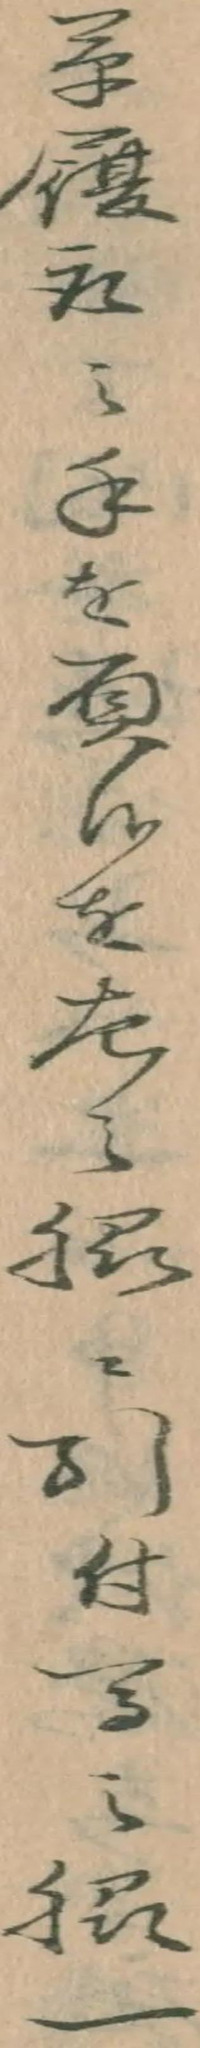草履取之手を負候を左之脇に引付馬之脇一
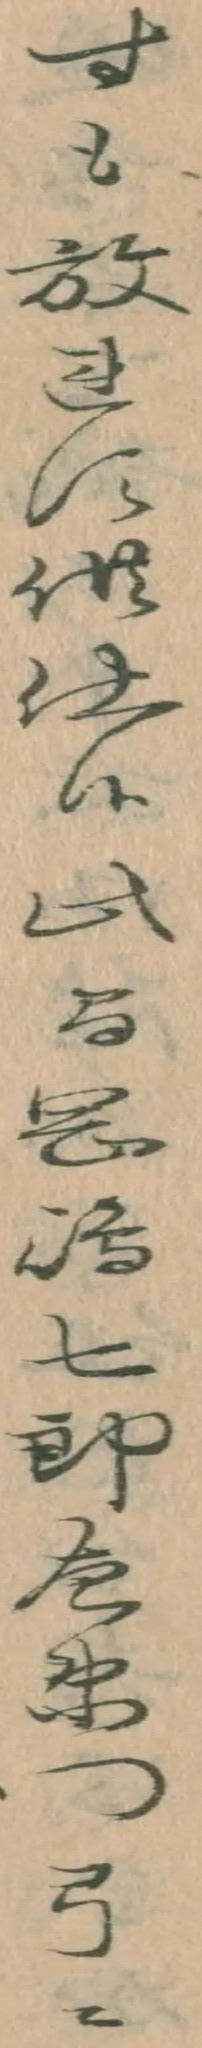寸も放連須供仕候此間岡島七郎左衛門弓に
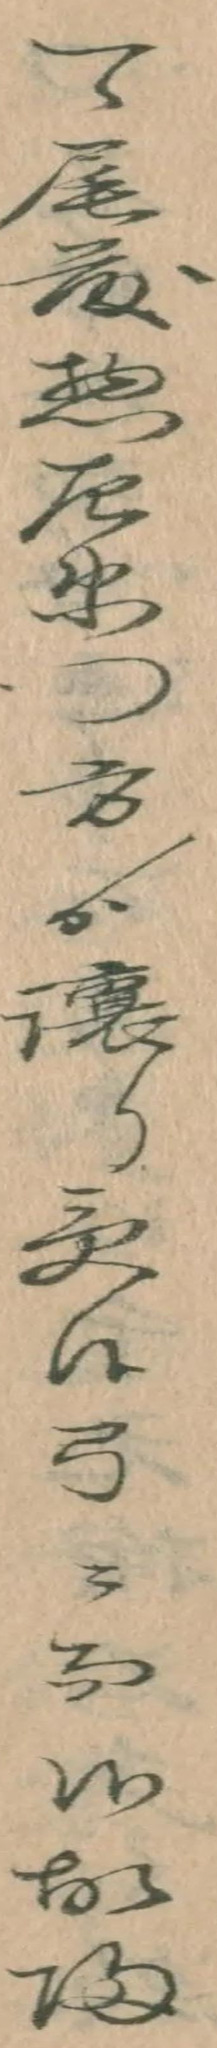て尾藤惣左衛門方ゟ譲り受候弓に而候故帰
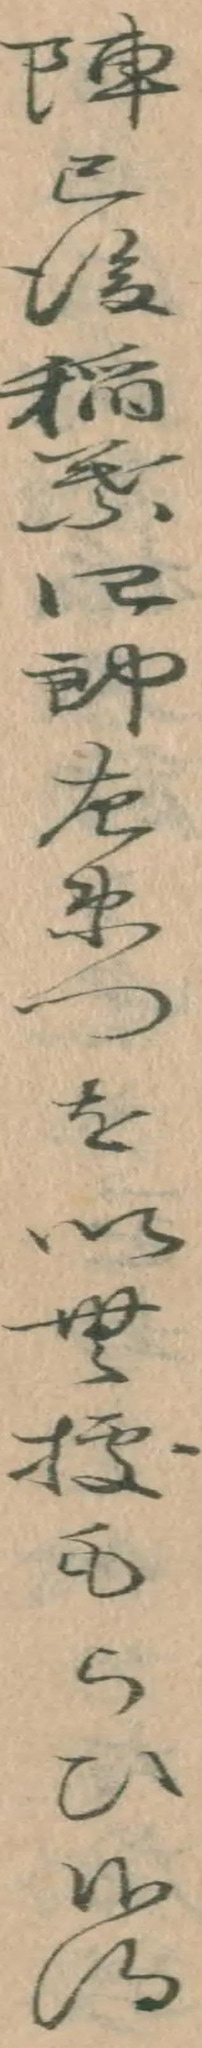陣已後稲葉四郎左衛門を以無拠もらひ候得
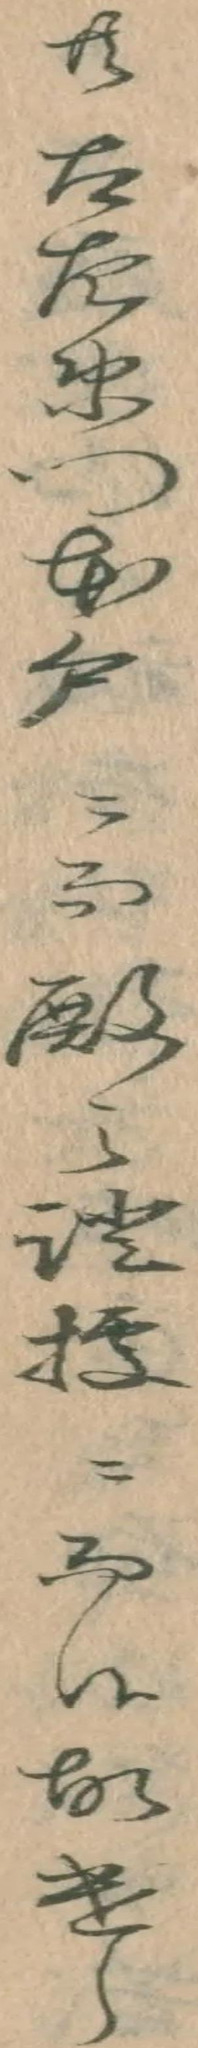共太左衛門本戸に而殿之證拠に而候故遣し
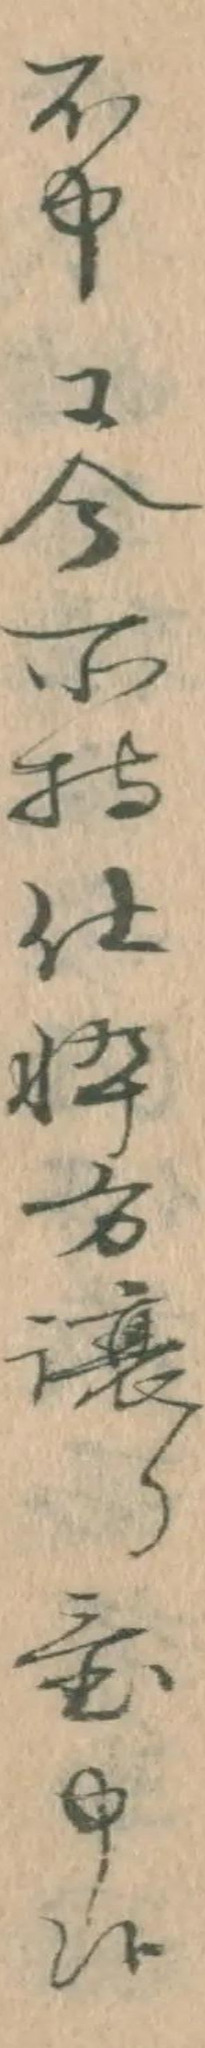不申尓今所持仕忰方譲り置申候
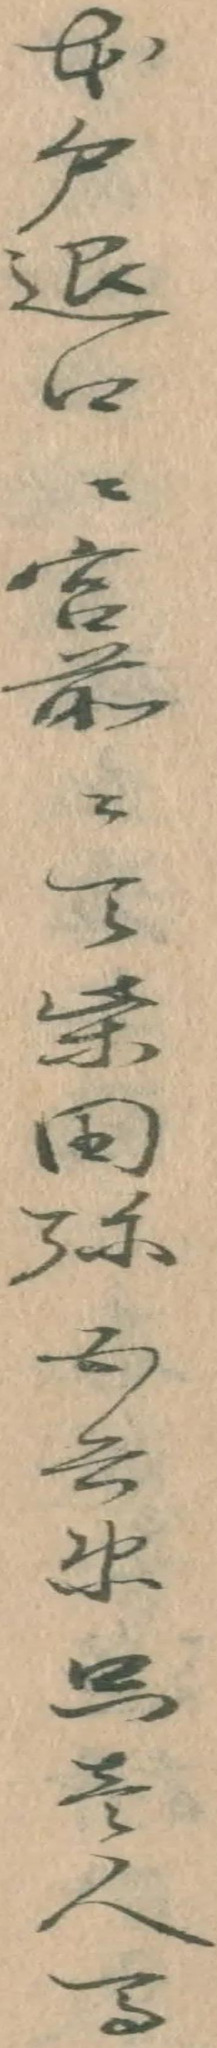本戸退口に宮前にて柴田弥五兵衛只壱人馬
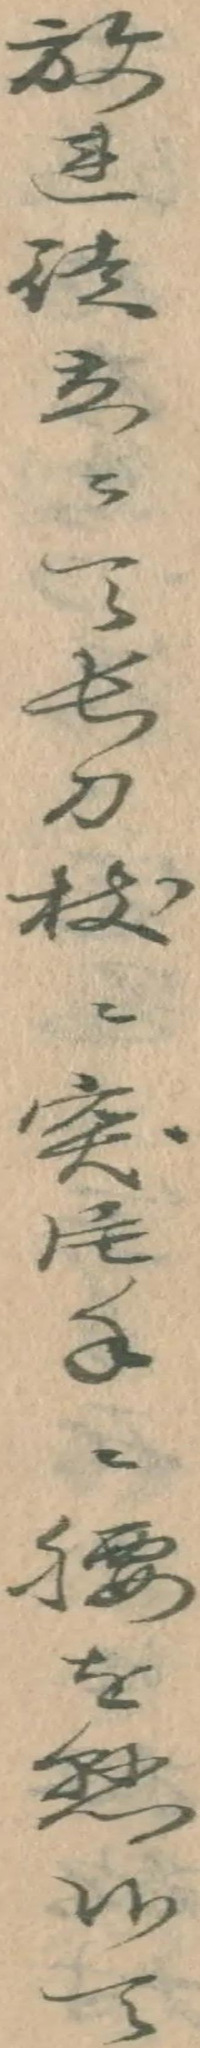放連徒立にて長刀杖に突片手に腰を懸候て
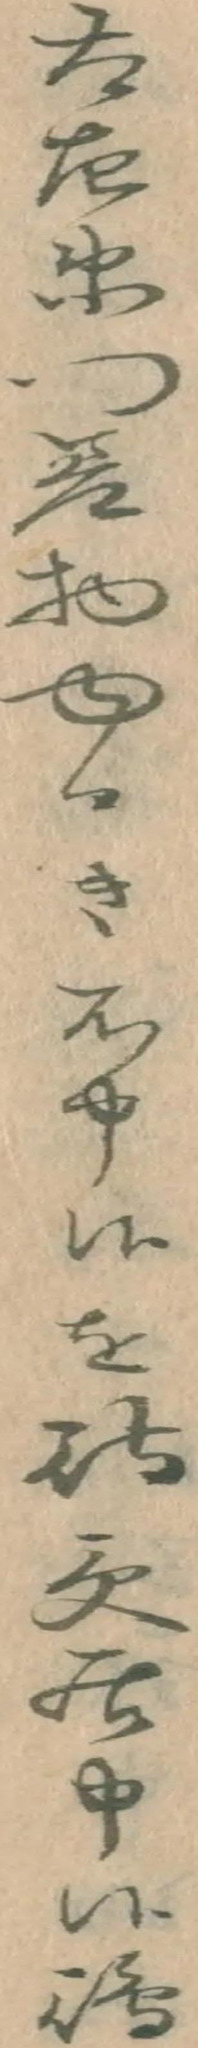太左衛門差物ゆかき不申候を待受居申候島
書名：切支丹御退治記 49巻. [2]
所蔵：国立国会図書館 National Diet Library, JAPAN
